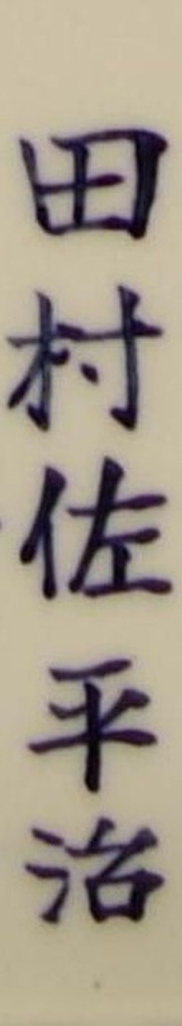田村佐平治
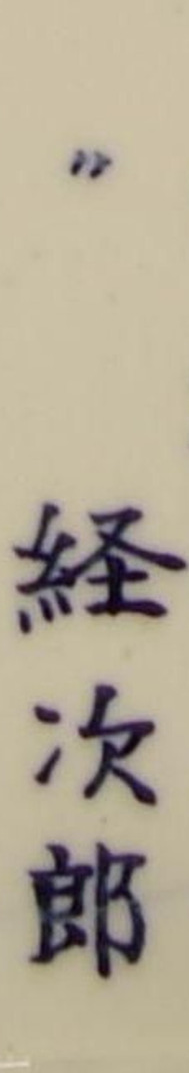経次郎
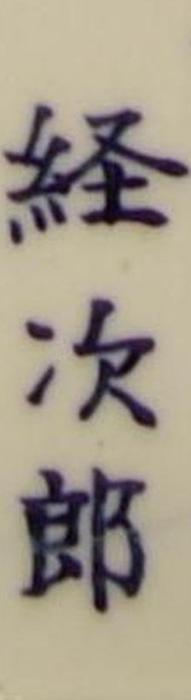経次郎

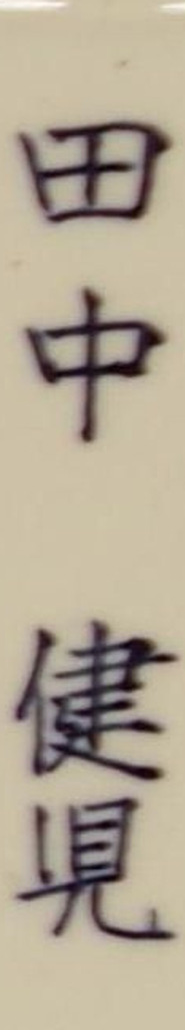田中健児
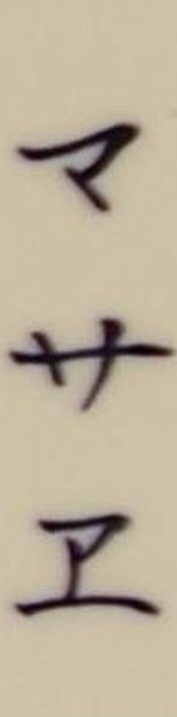マサヱ
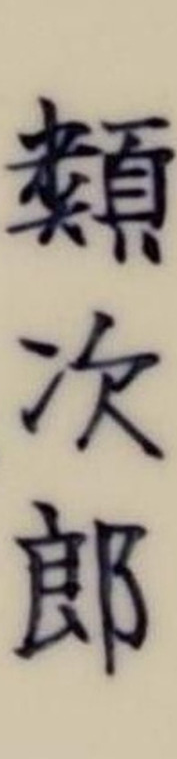類次郎
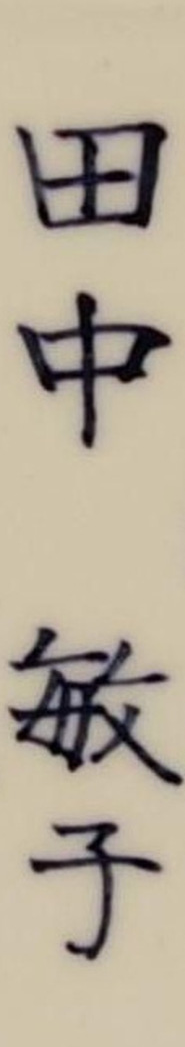田中敏子
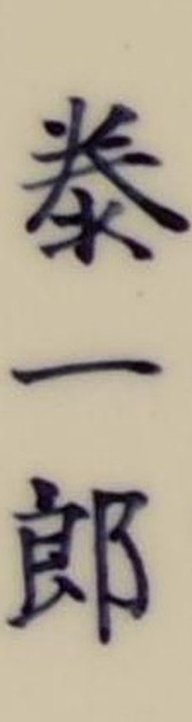泰一郎
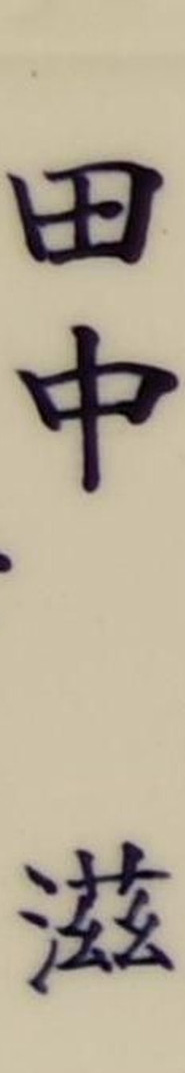田中滋
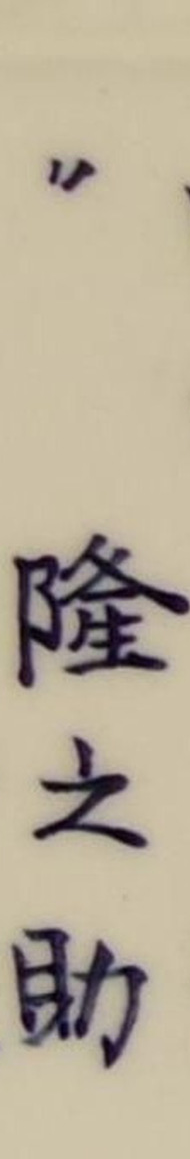隆之助
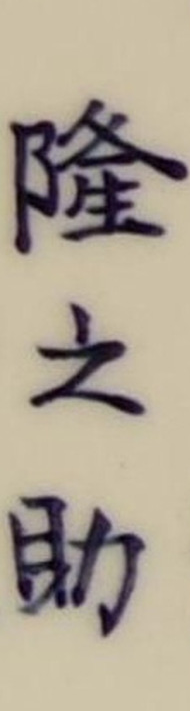隆之助
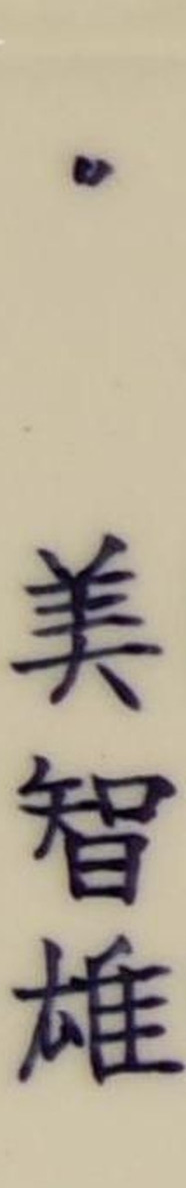美智雄
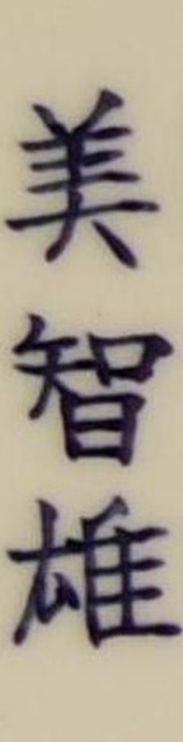美智雄

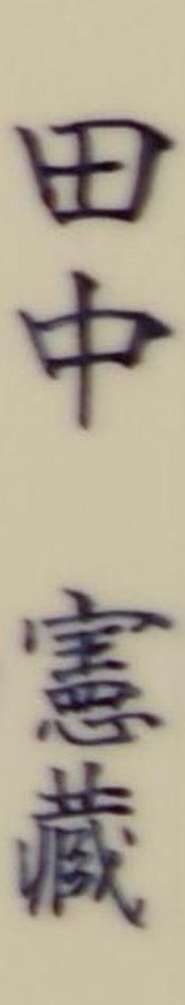田中憲藏
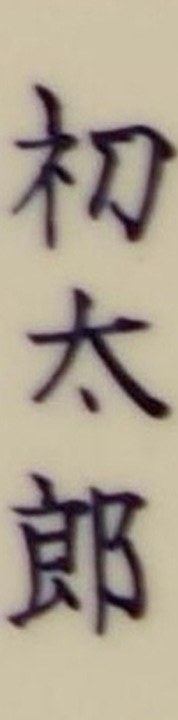初太郎
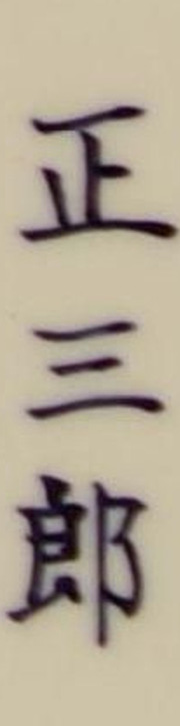正三郎
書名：A~D
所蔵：koyasan kongobuji
